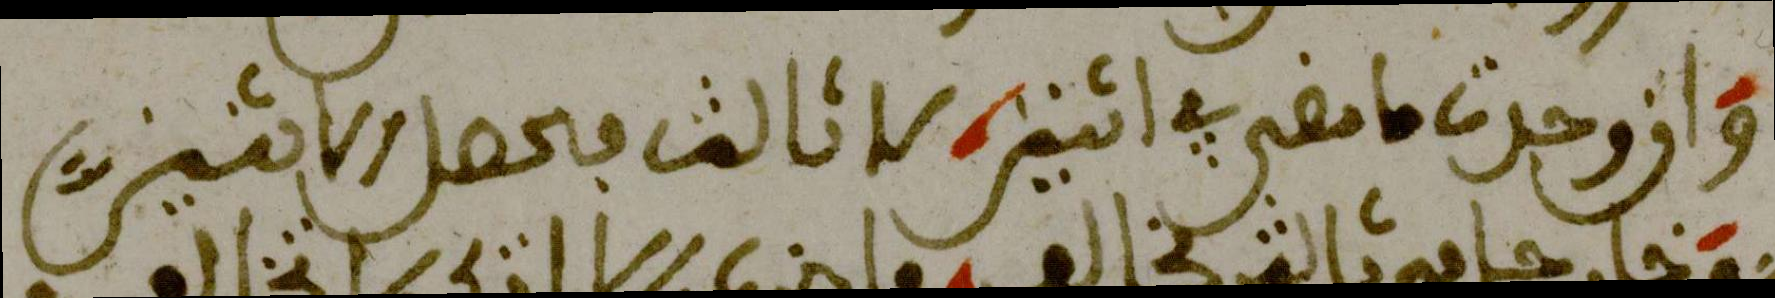وَان وجدت ما مضى في اثنين لا ثالث فحصل الاثنين
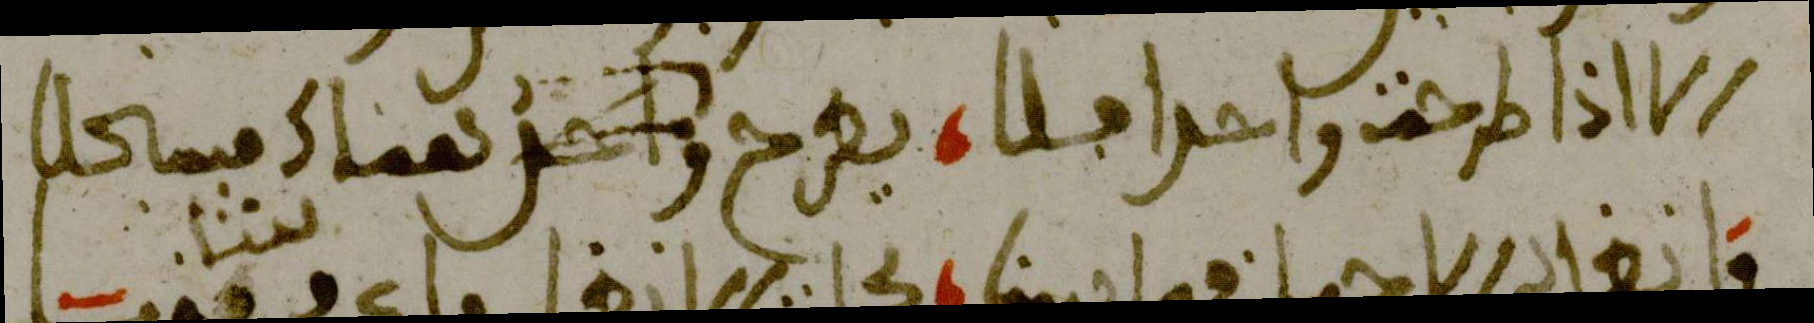الا اذا طرحت واحد افلا يطرح واحد هناك مسجلا
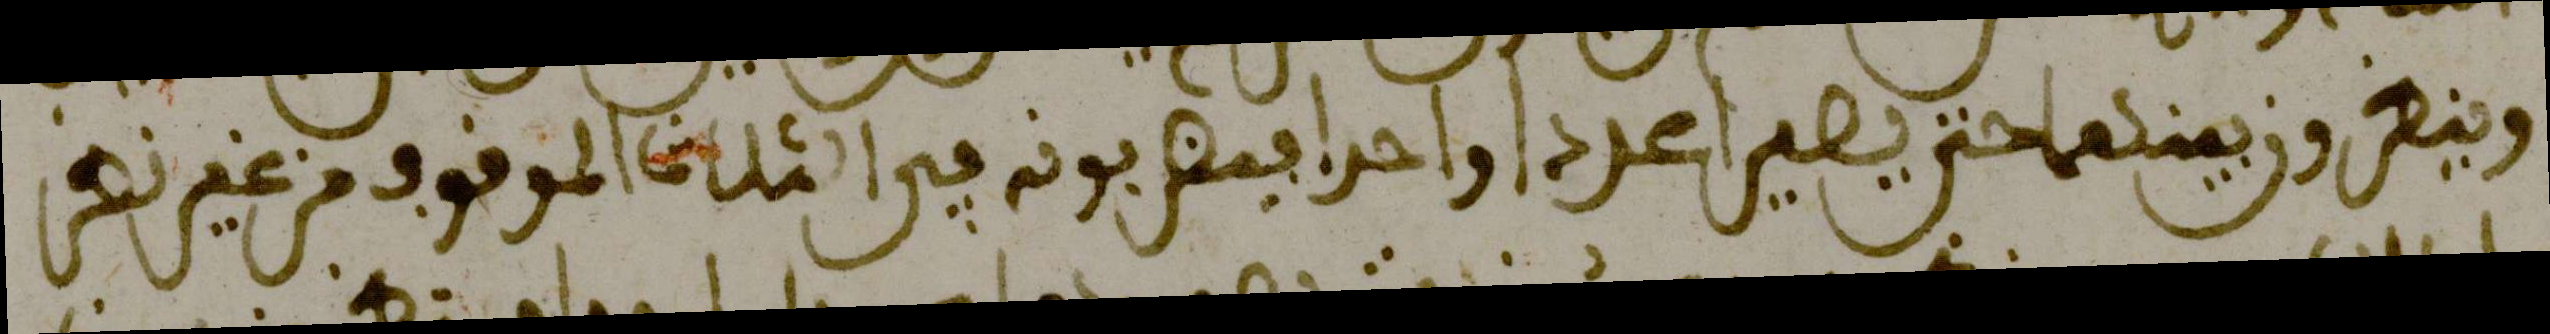وينظرون بينهما حتى يصيرا عددا واحدا فيضربونه في الثلاث الموقوف من غير نظر
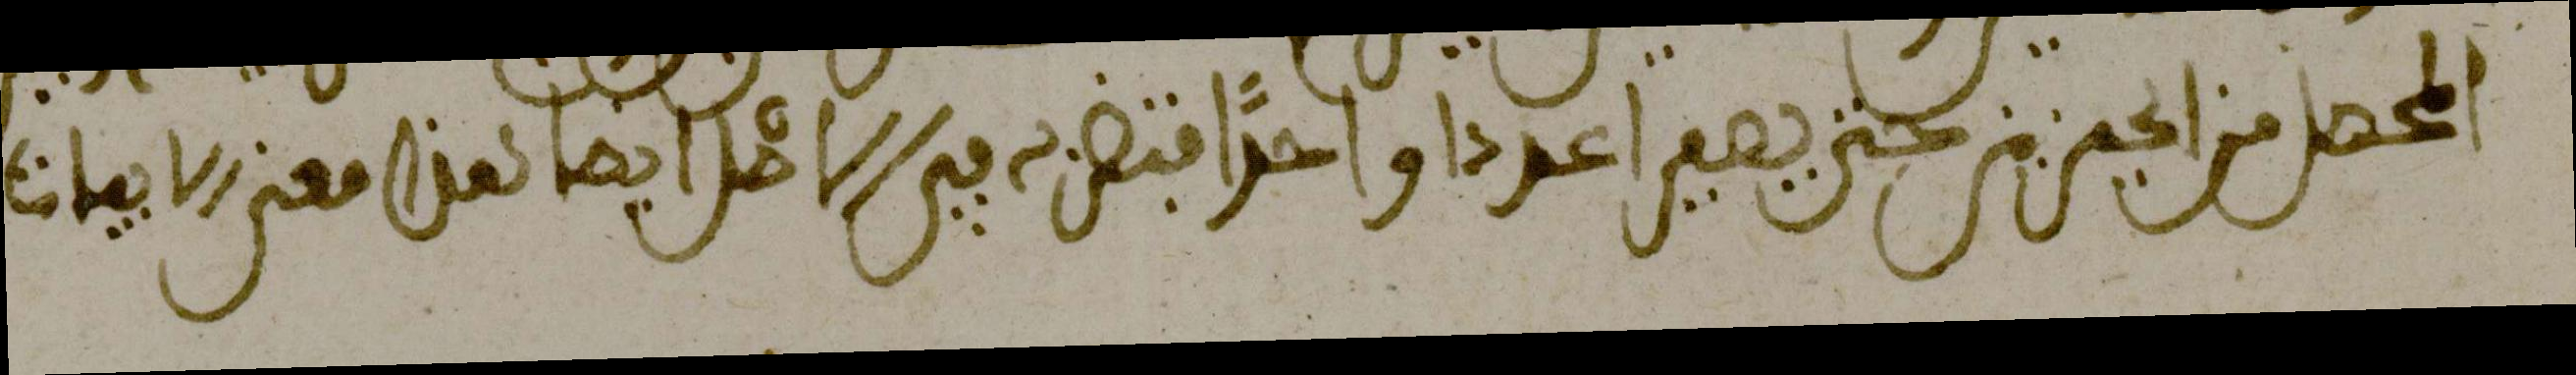المحصل من الحيزين حتى يصيرا عددا واحدًا فتضربه في الاصْل ايضا هذا معنى الابيات
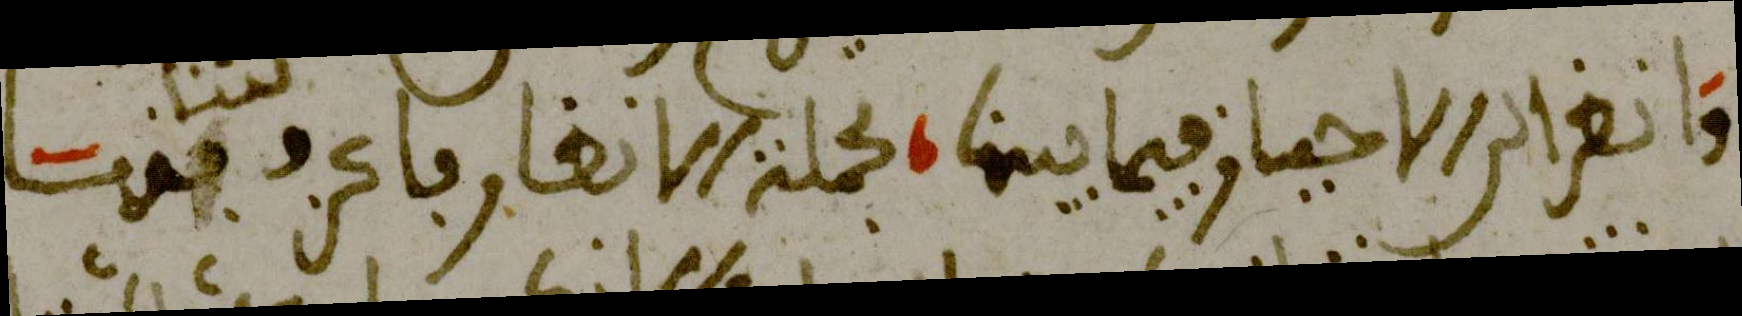وَانظر الى الاحياز فيها بينها بجملة الانظار فاعرف بها
